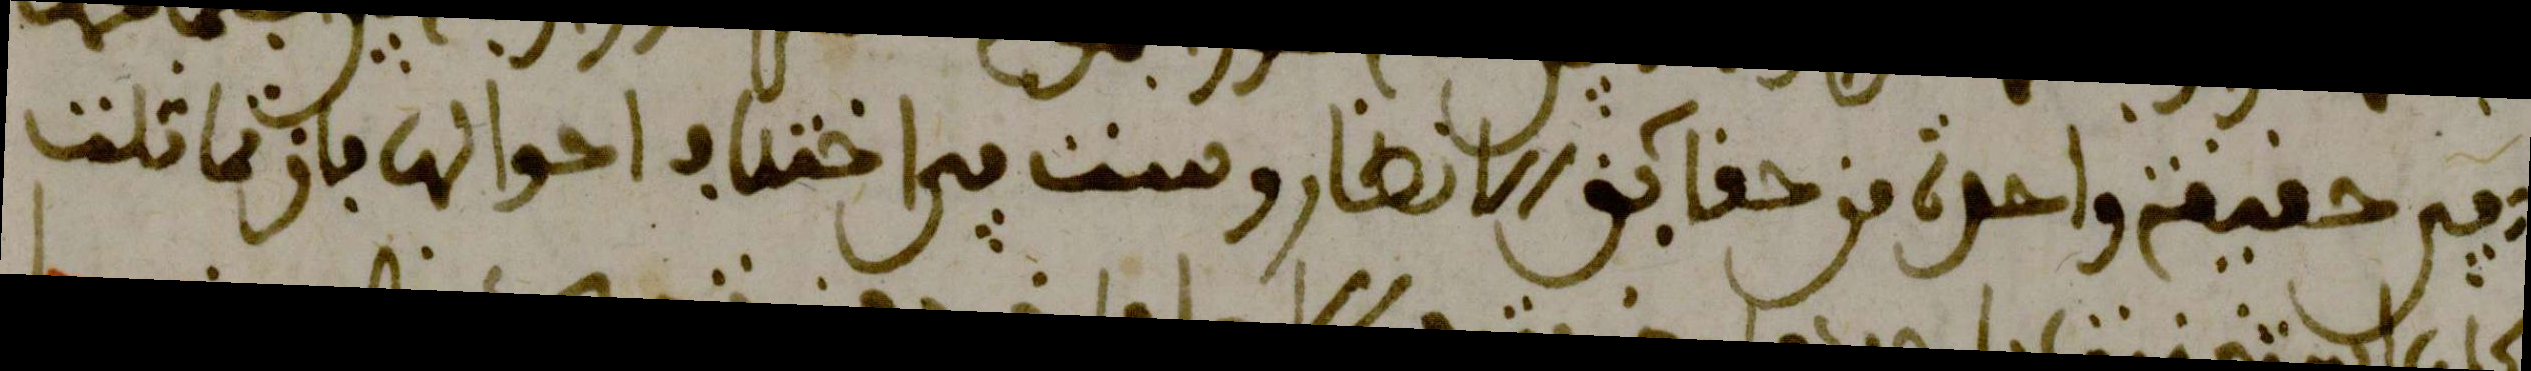في حقيقة واحدة من حقائق الانظار وست في اختلاف احوالها فان تماثلت
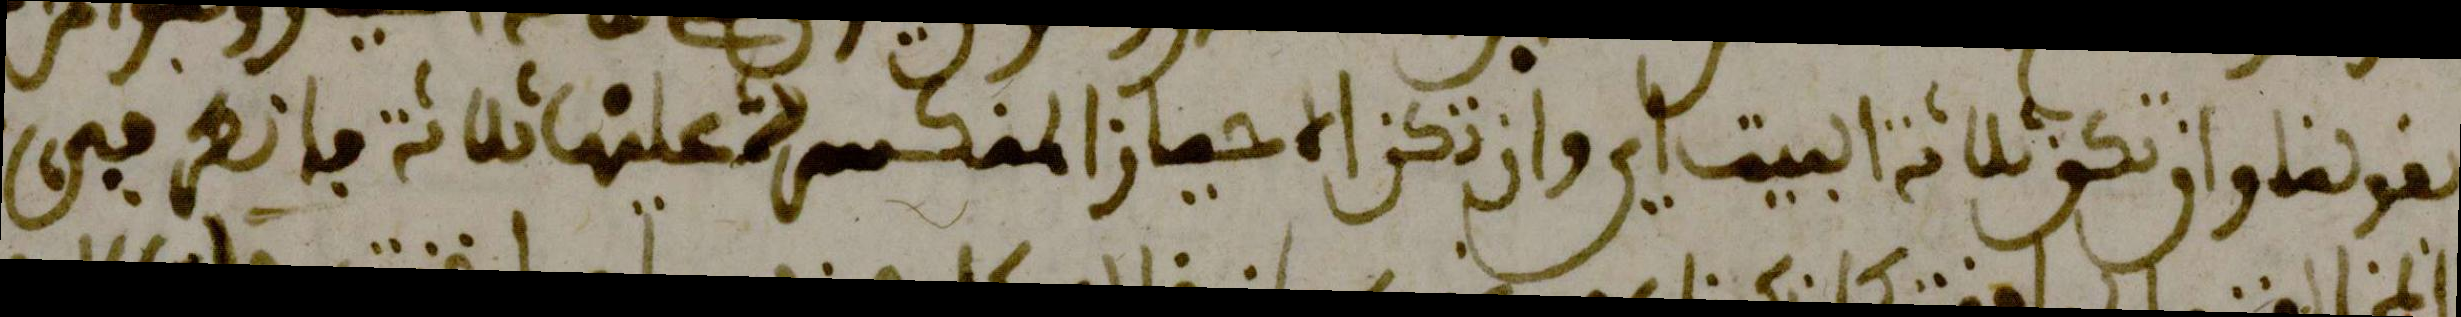بقولنا وان يكن ثلاثة البيت اي وان تكن الاحياز المنكسر عليْها ثلاثة فانظر في
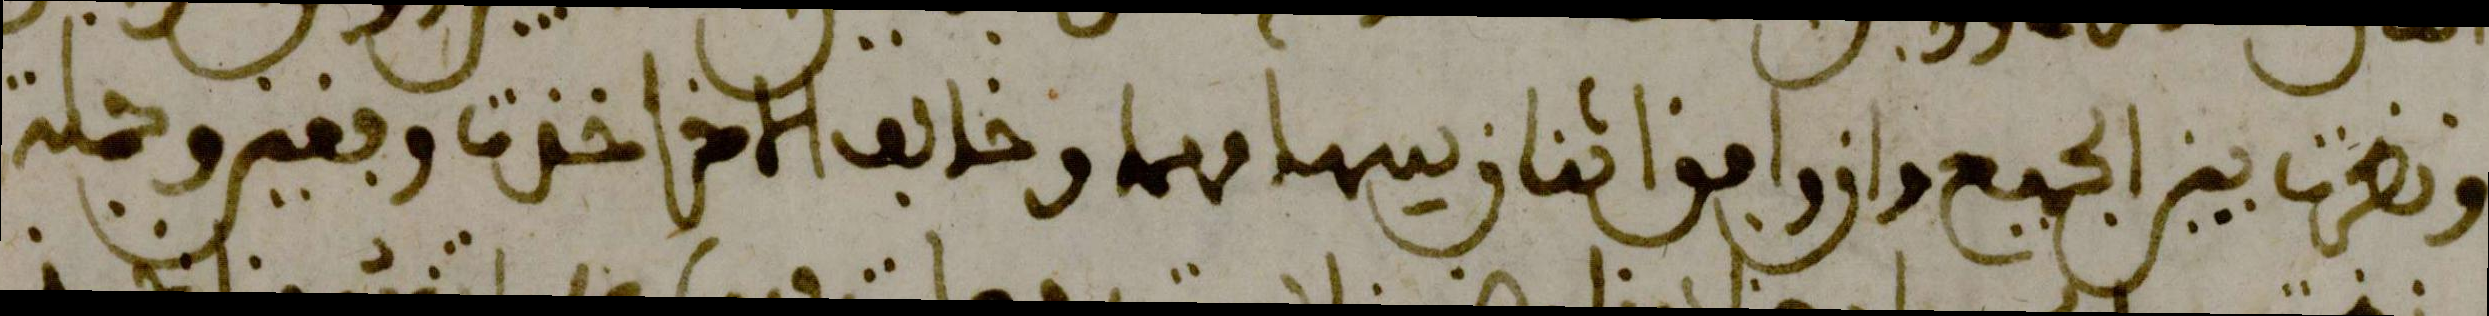ونظرت بين الجميع وان وافق اثنان سِهامهما وخالف الاخر اخذت وفقين وجملة
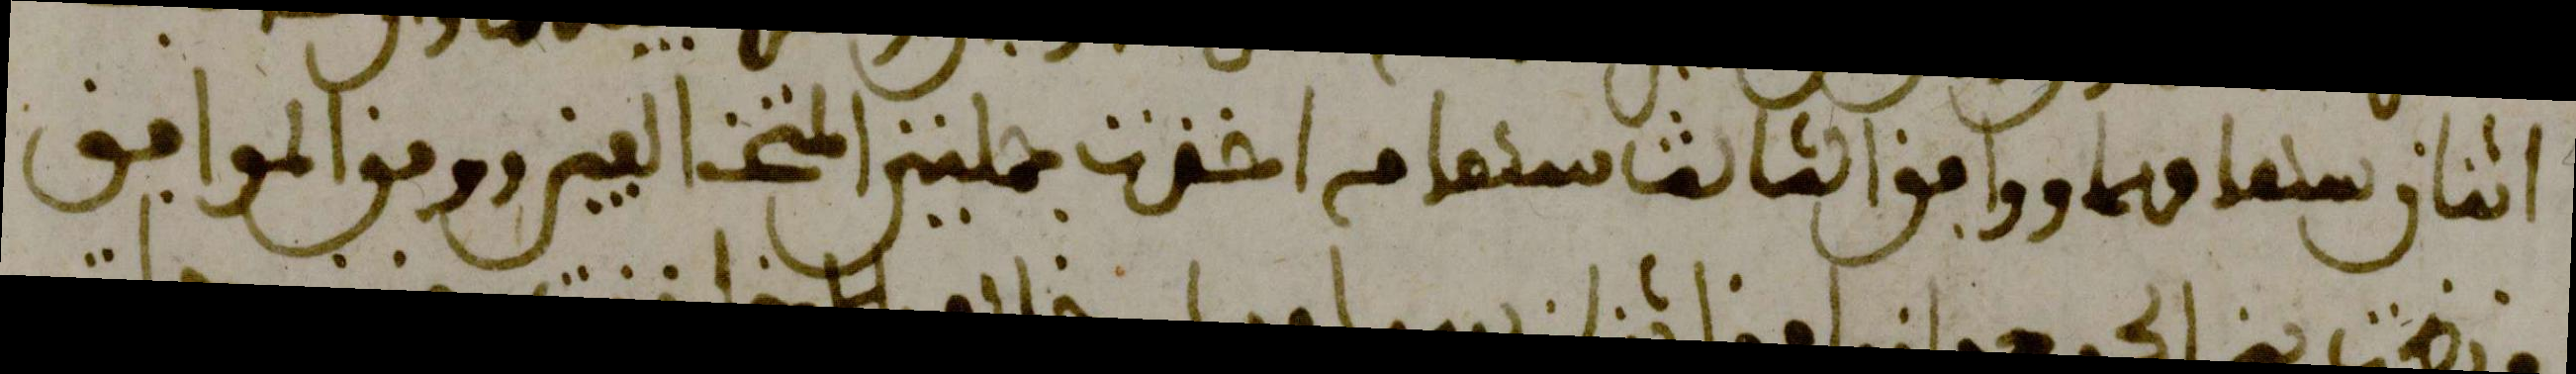اثنان سهامهما ووافق الثالث سهامه اخذت جملتي المتخالفين ووفق من الموافق
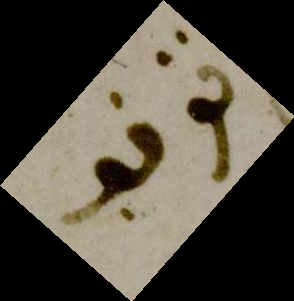توقف
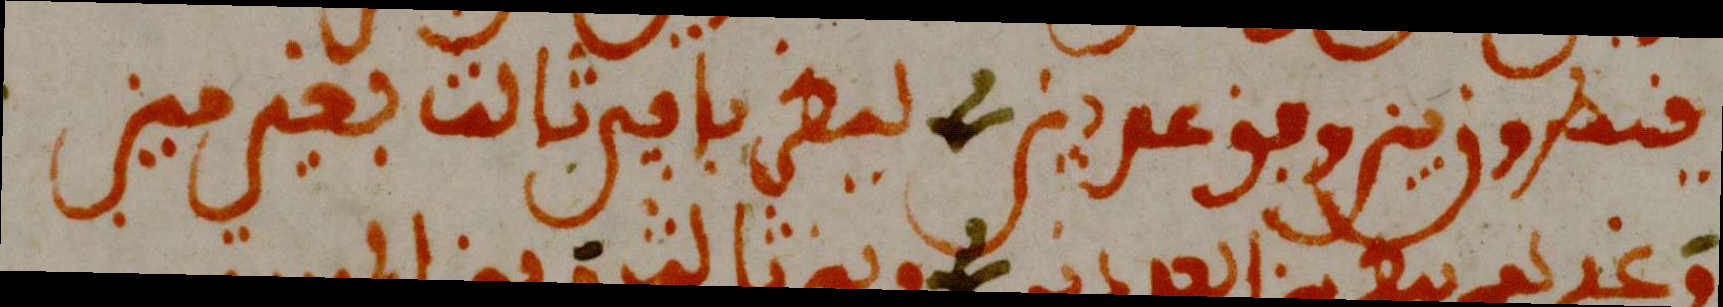فينظرون بين وفق عددين ليضربا في ثالث بغير مين
